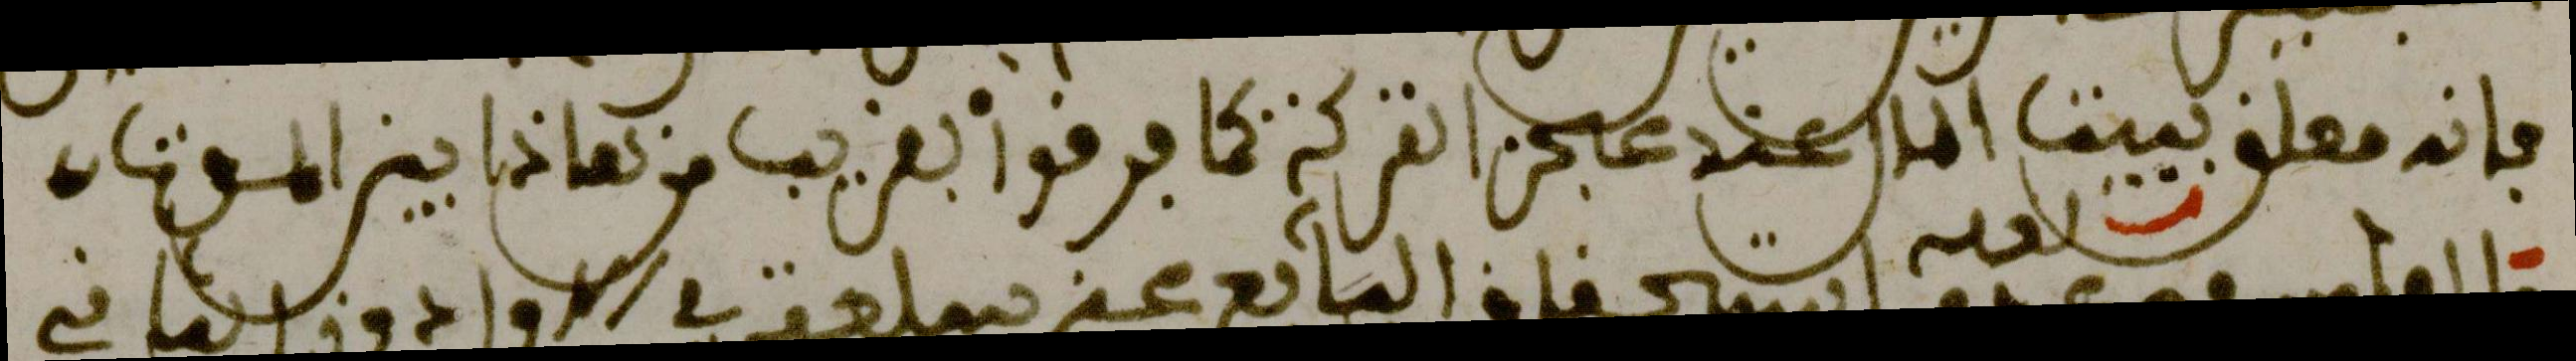فانه معلق ببيت المال عند عجز التركة كما فرقوا بقريب من هاذا بين الموت
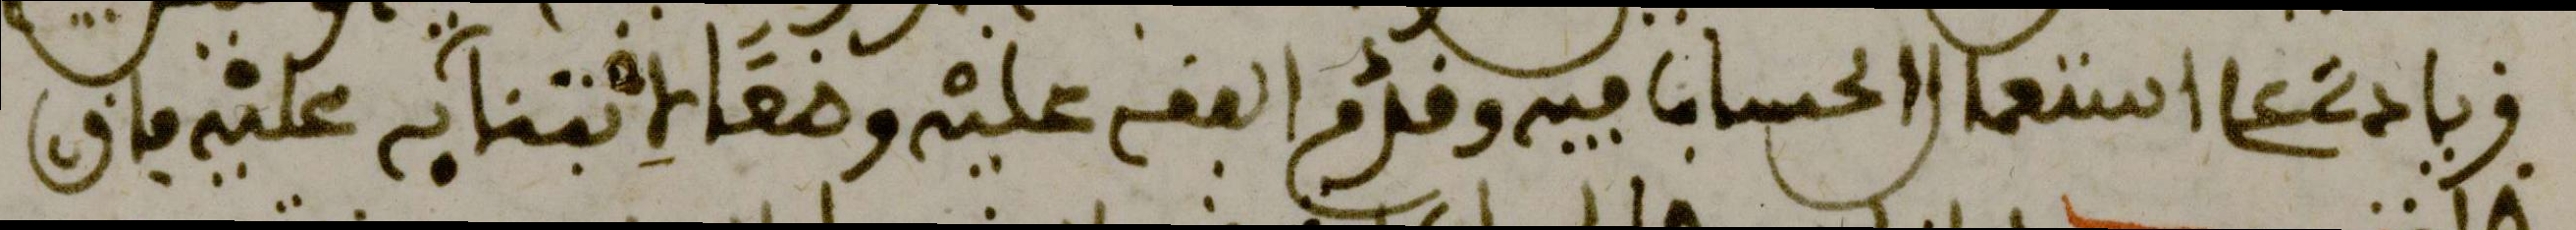زيادة على استعمال الحساب فيه وقدم الفقه عليْه وضعا لِاتبنائه عليْه فان
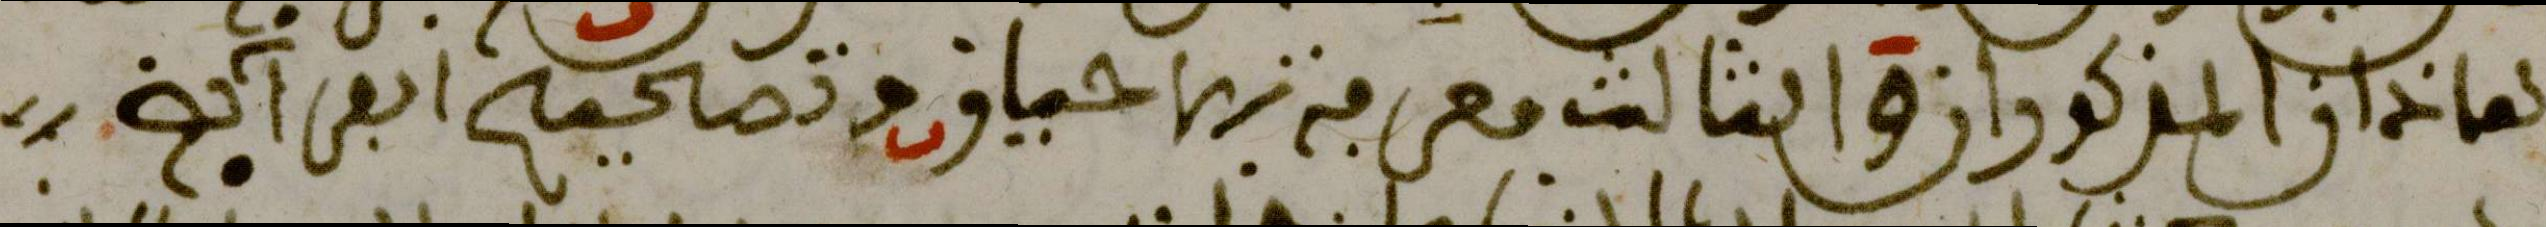هاذ ان المذكوران وَالثالث معرفة الاحياز وتصحيح الفرائض
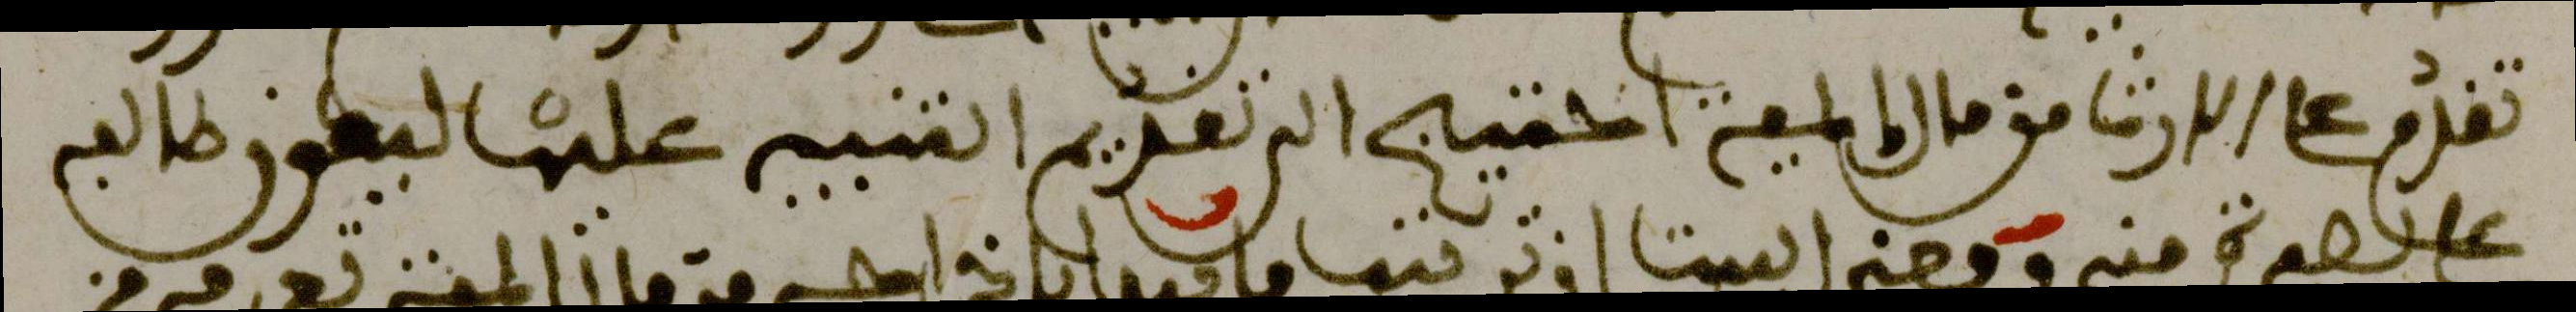تقدم على الارث من المية احتيج الى تقديم التنبيه عليْها ليكون طالبه
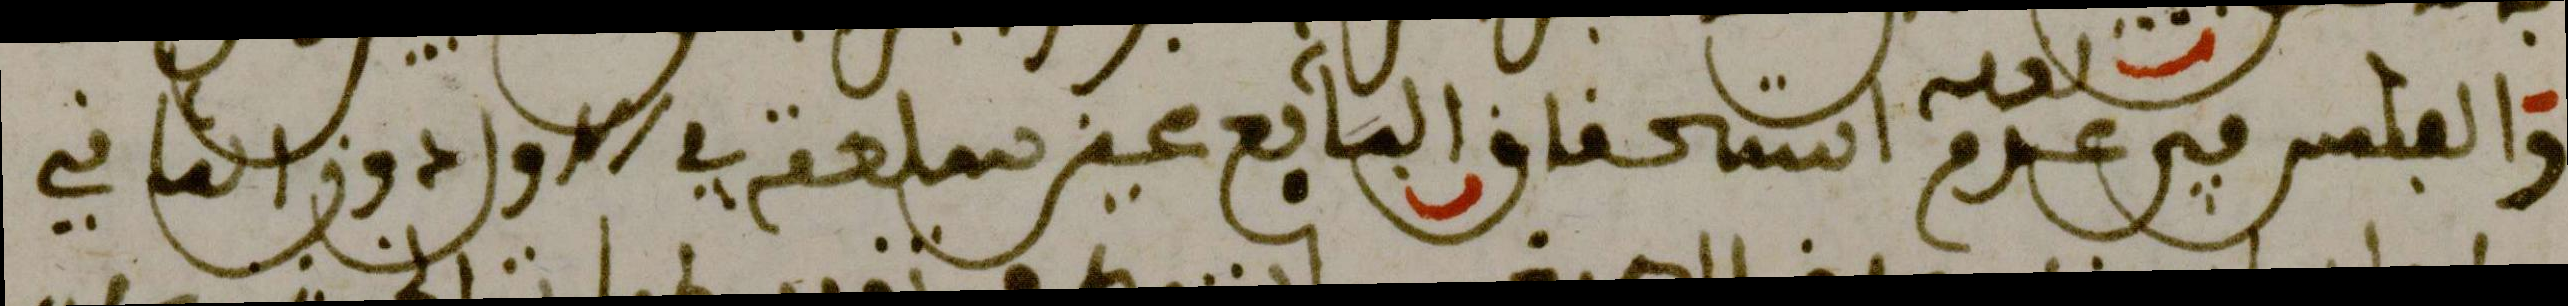وَالفلس في عدم استحقاق البائع عين سلعته في الاول دون الثاني
